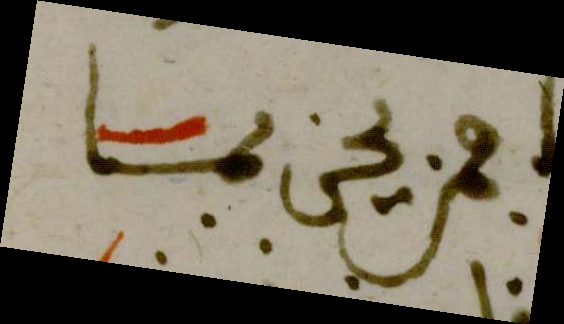فمن يجز بما
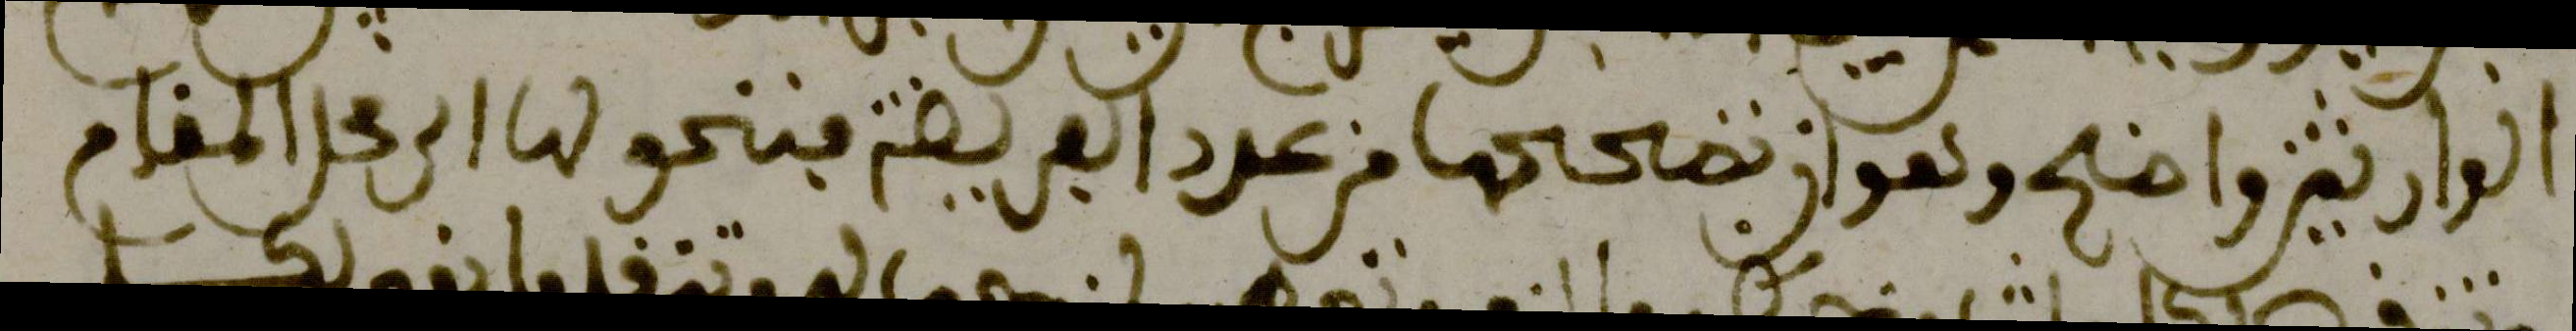الوارثين واضح وهو ان تصححها من عدد الفريضة فتحولها الى محل المقام
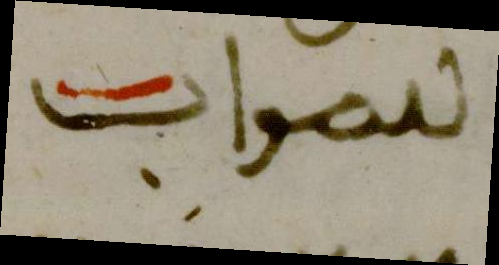للصواب
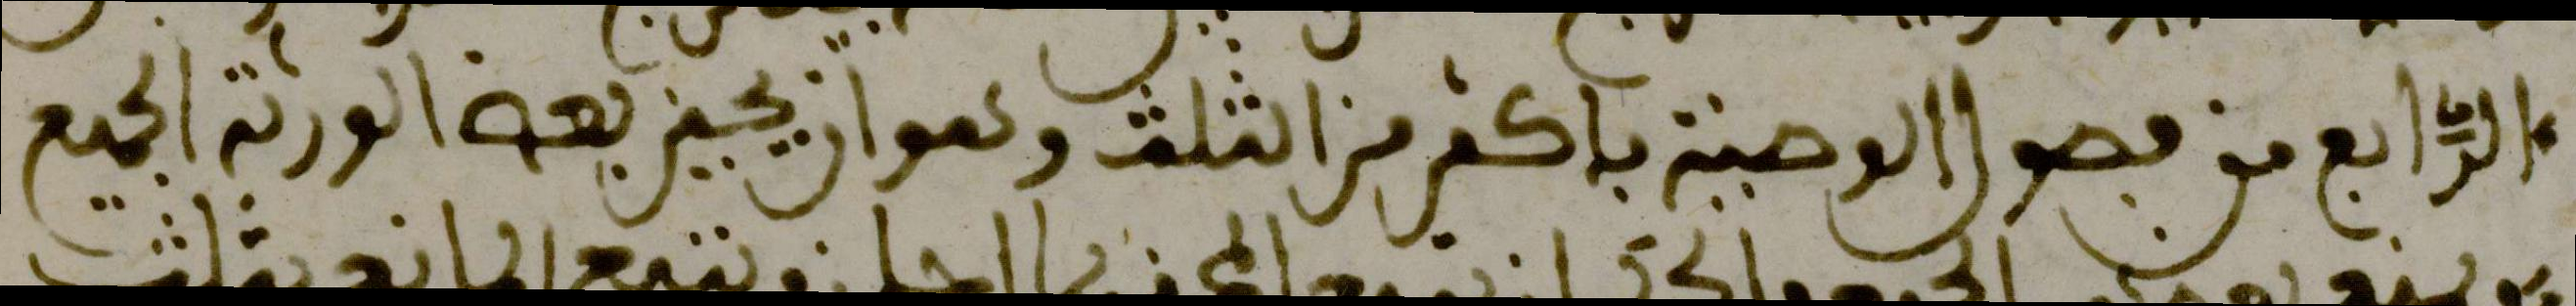الرّابع من فصول الوصية باكثر من الثلث وهو ان يجيز بعض الورثة الجميع
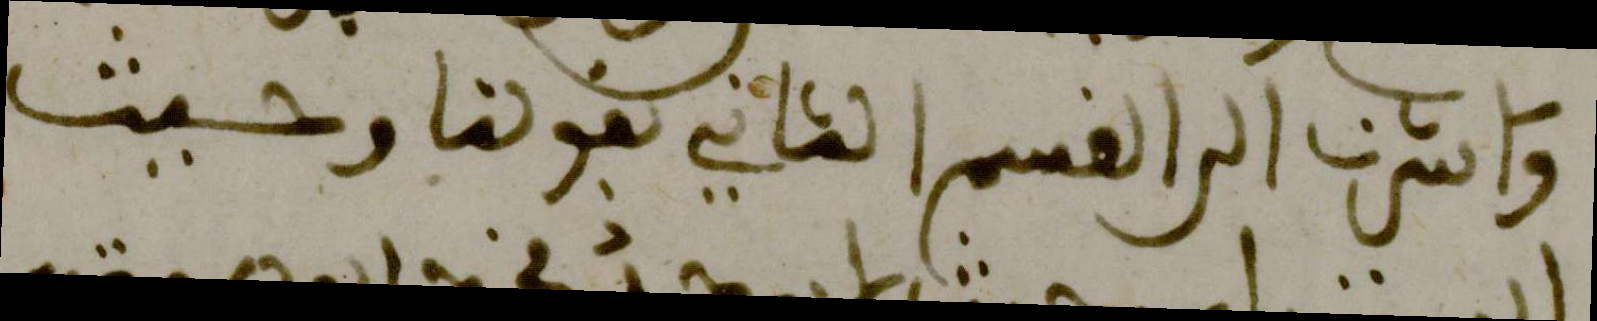واشرب الى القسم الثاني بقولنا وحيث
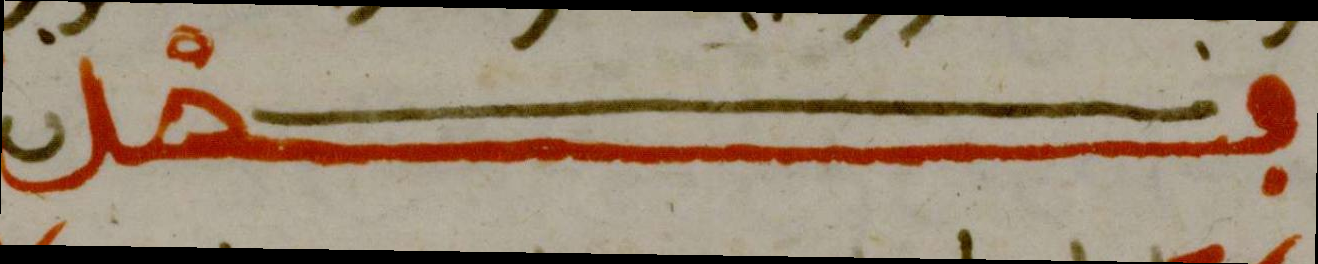فصل
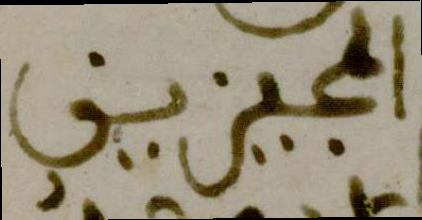المجيزين
